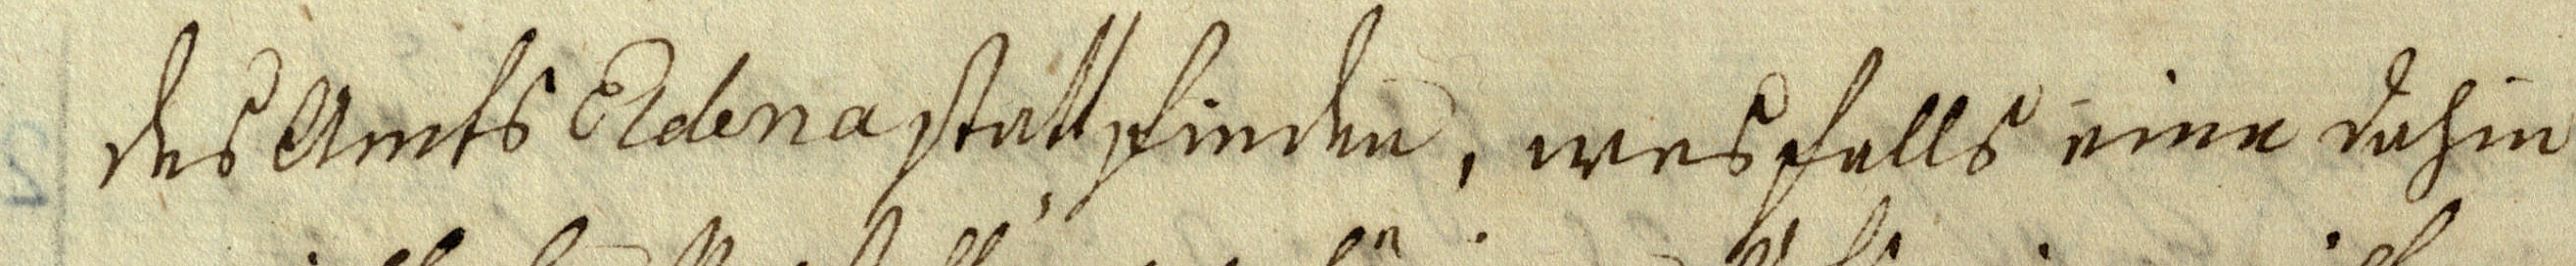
des Amts Eldena stattfinden, wesfalls eine dahin
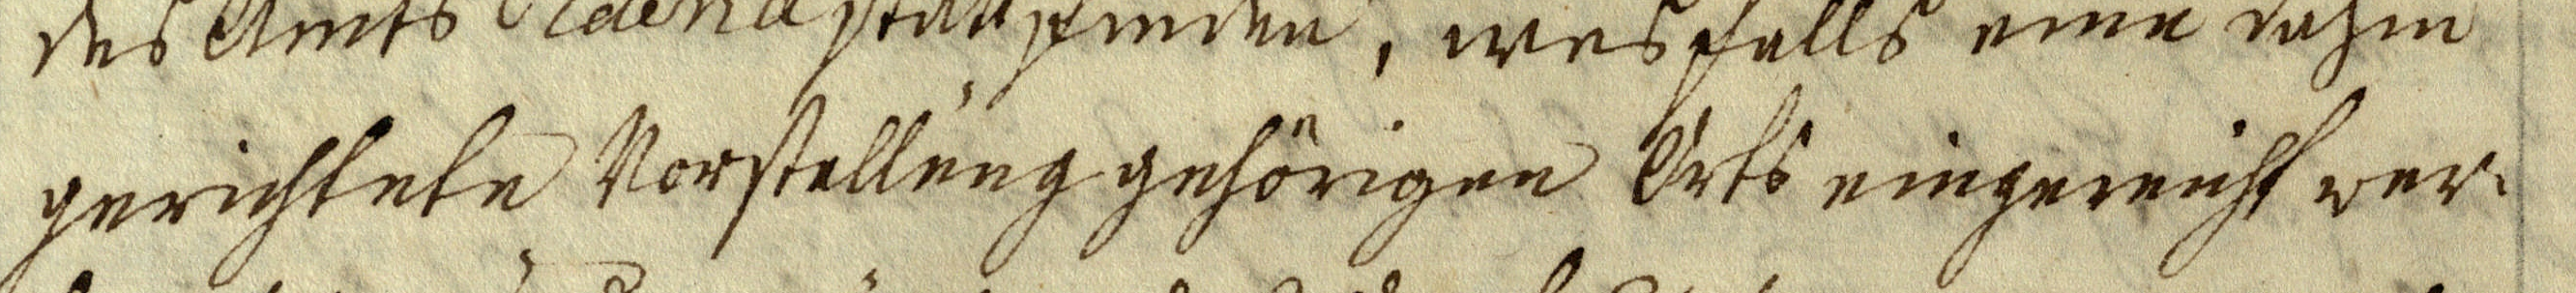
gerichtete Vorstellung gehörigen Orts eingereicht wer¬
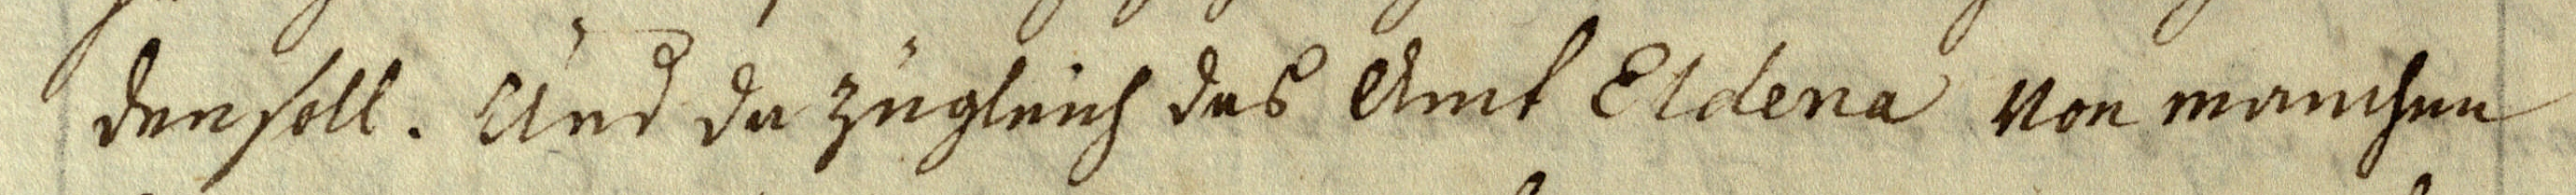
den soll. Und da zugleich das Amt Eldena von manchen
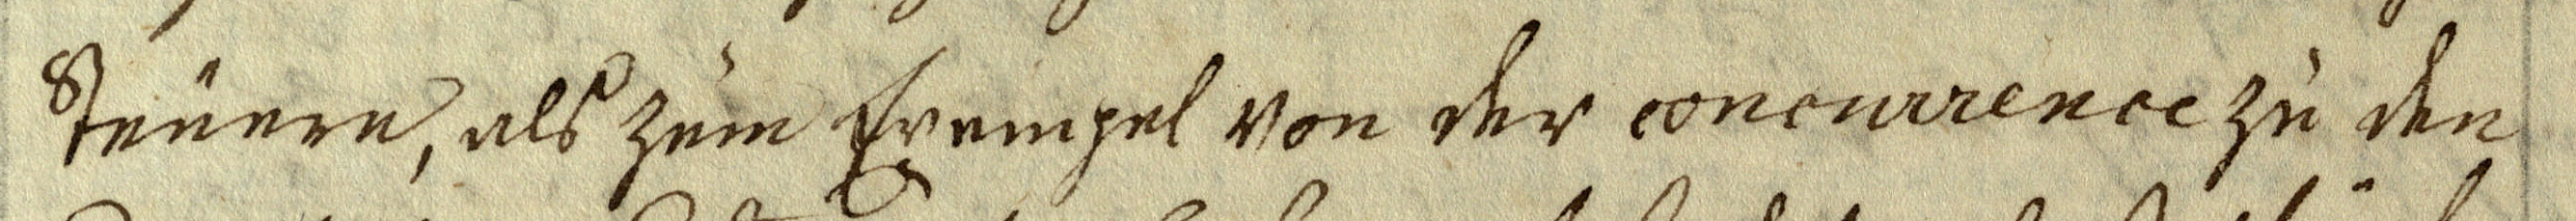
Steuern als zum Exempel von der concurrence zu den
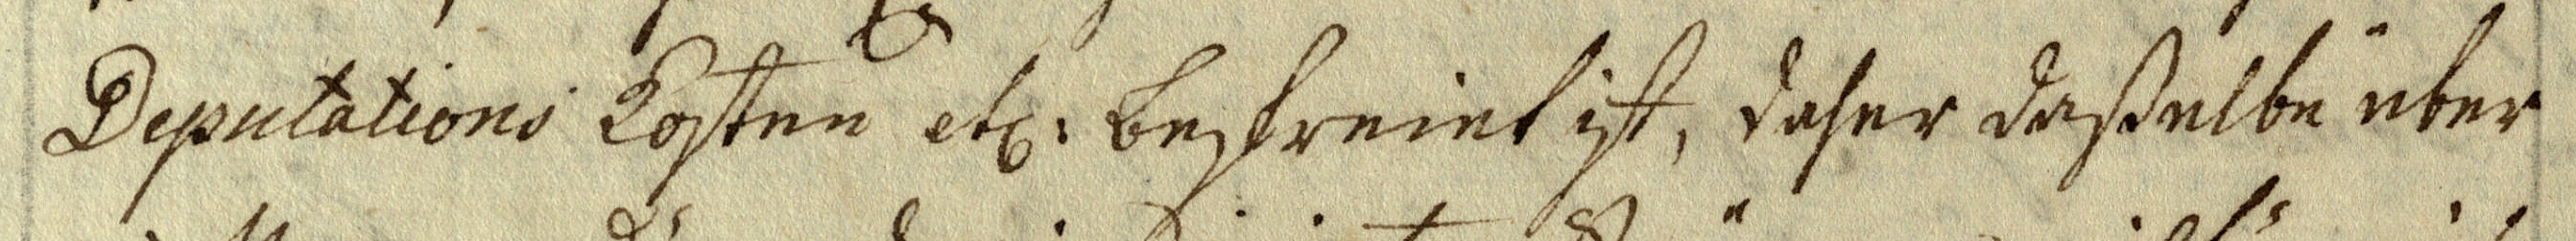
Deputations Kosten etc. befreiet ist, daher daßelbe über
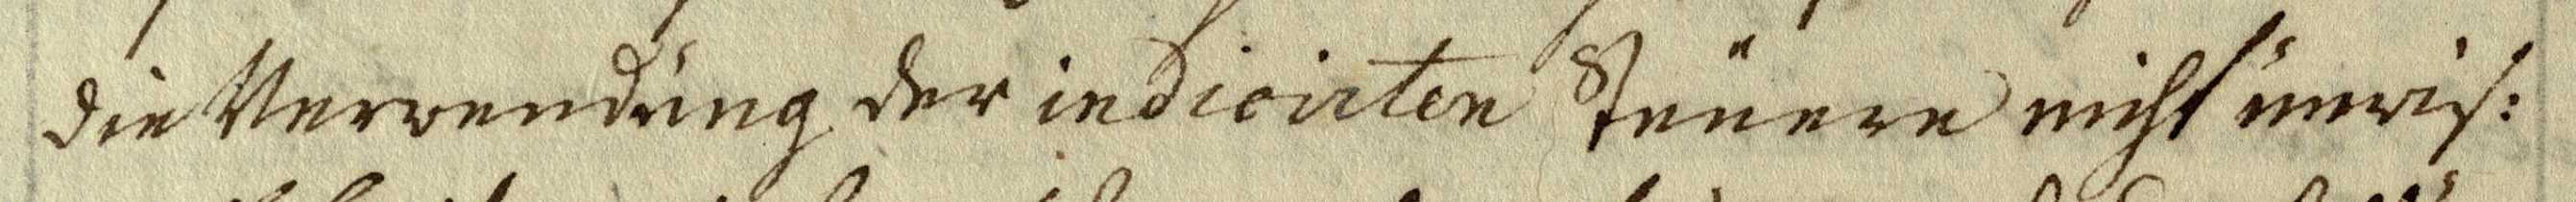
die Verwendung der indicirten Steuern nicht unwis¬
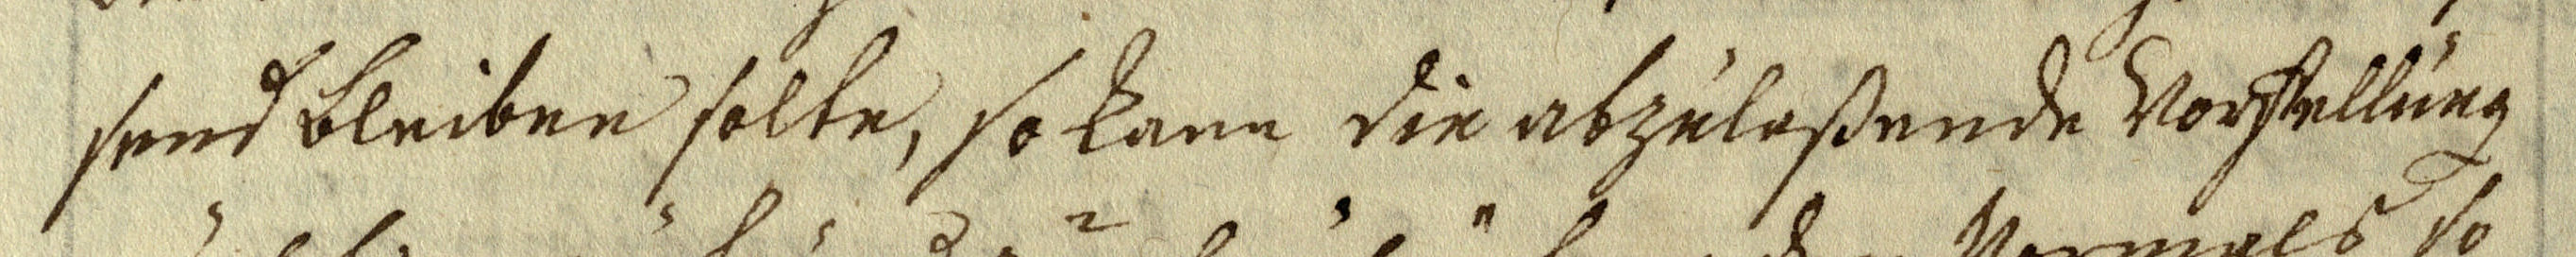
send bleiben solte, so kann die abzulaßende Vorstellung
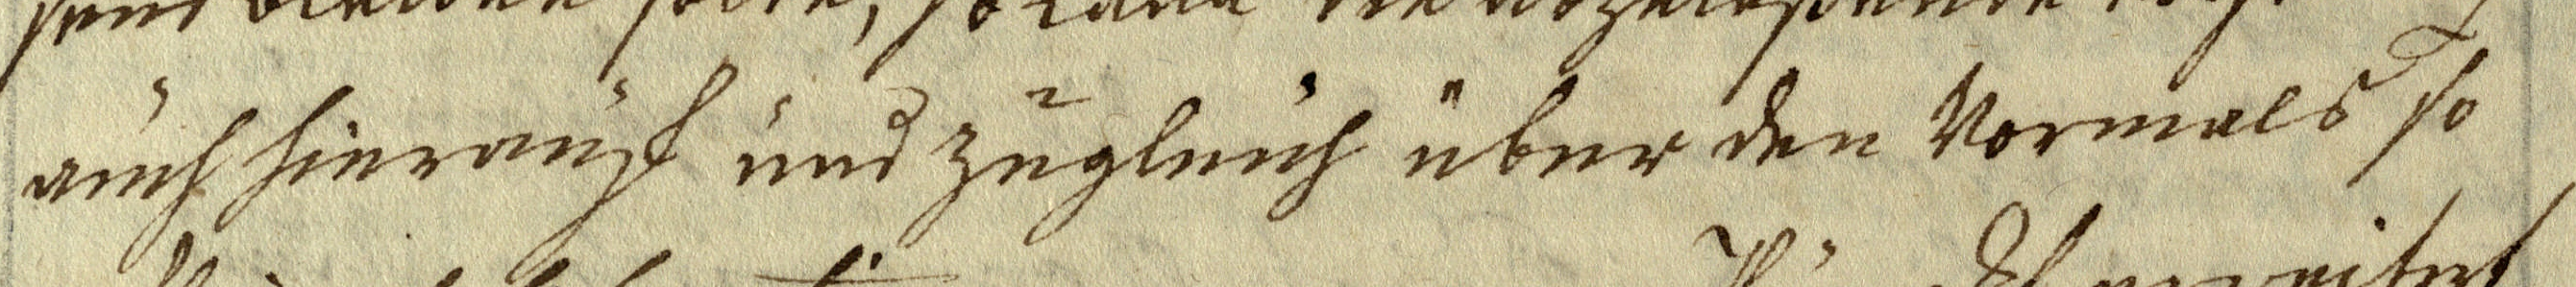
auch hierauf und zugleich über den vormals so
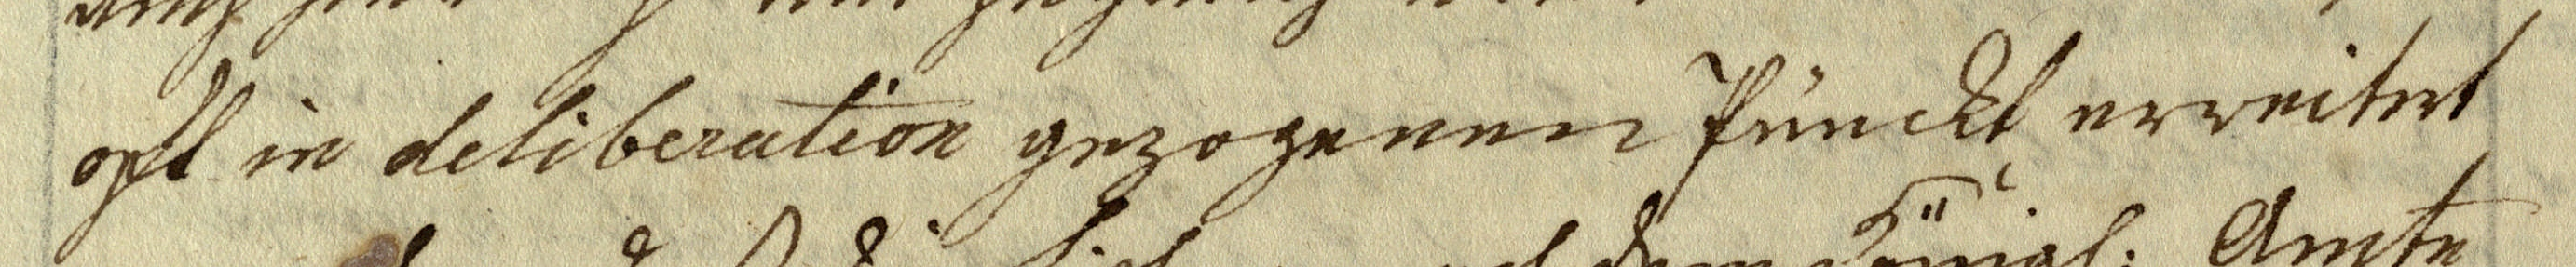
oft in deliberation gezogenen Punckt, erweitert
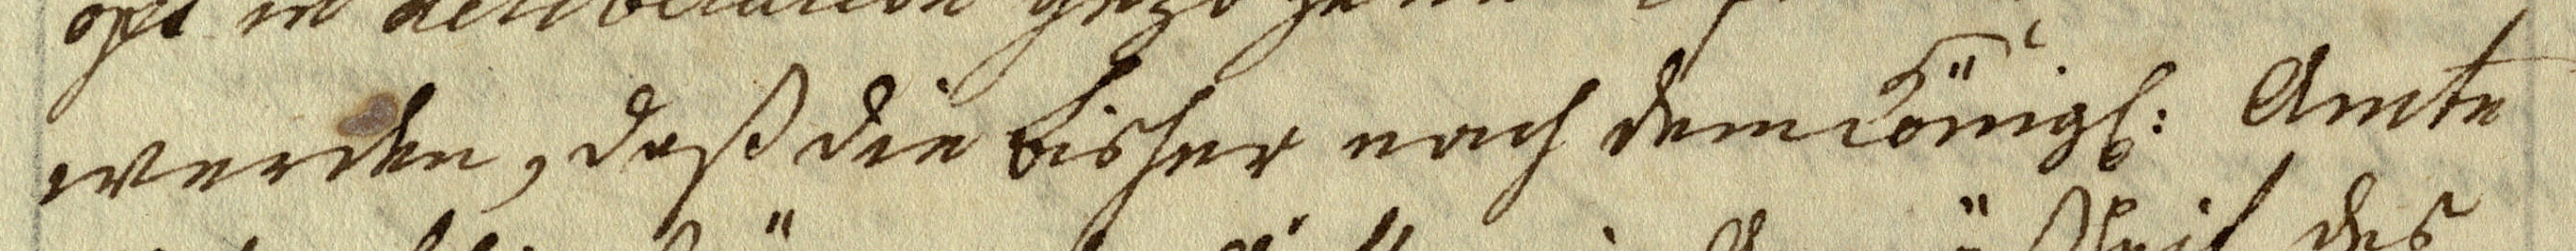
werden, daß die bisher nach dem Königl. Amte
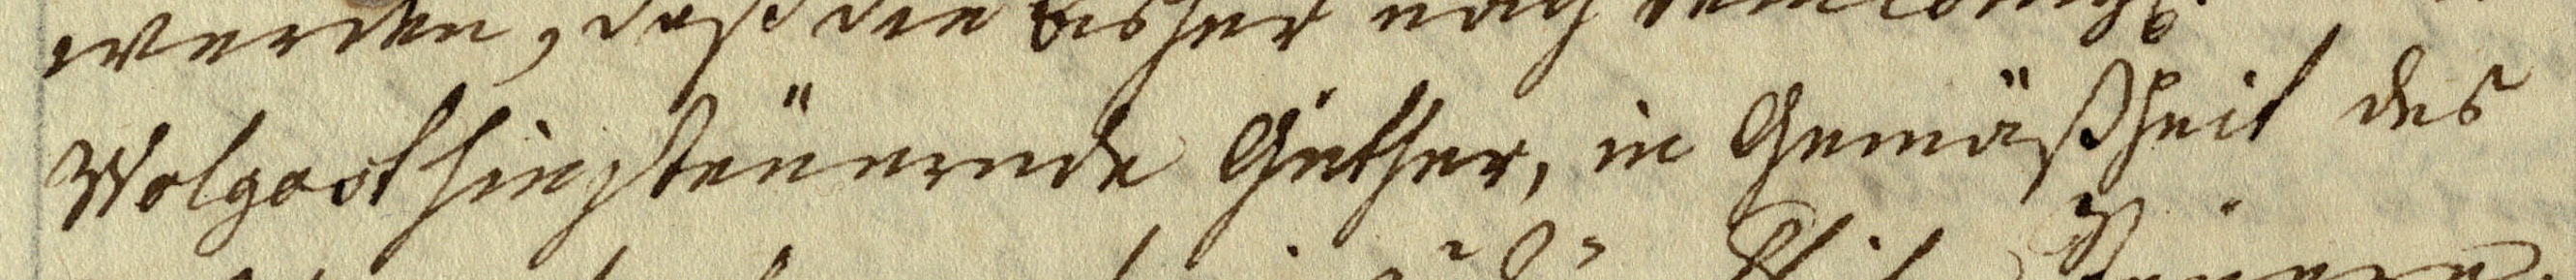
Wolgast hinsteuernde Güther, in Gemäßheit des
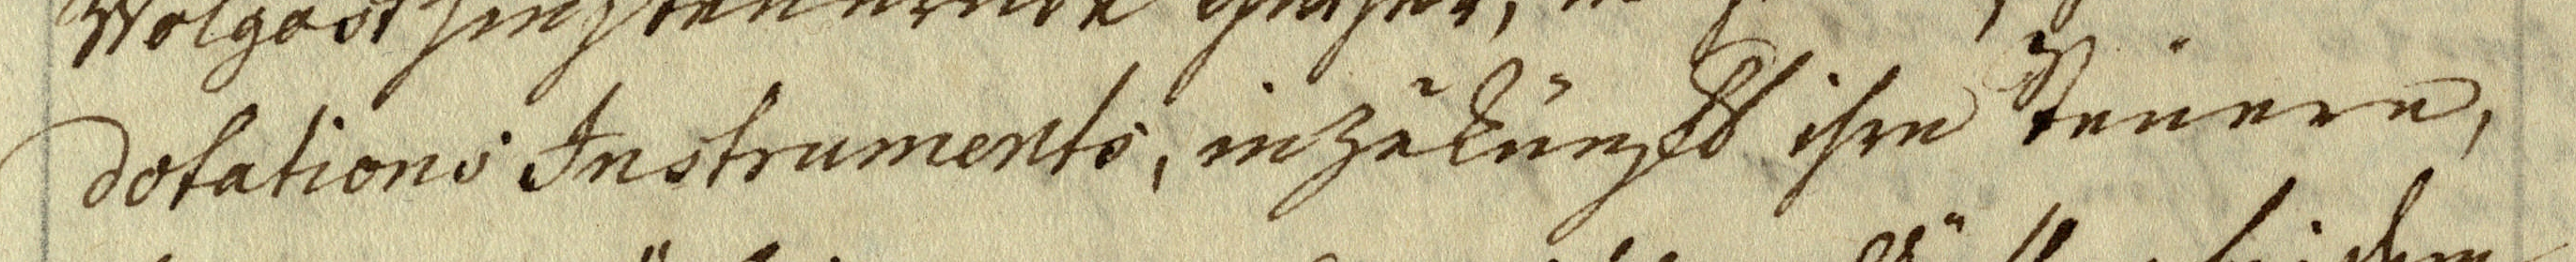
dotations Instruments, in Zukunft ihre Steuern,
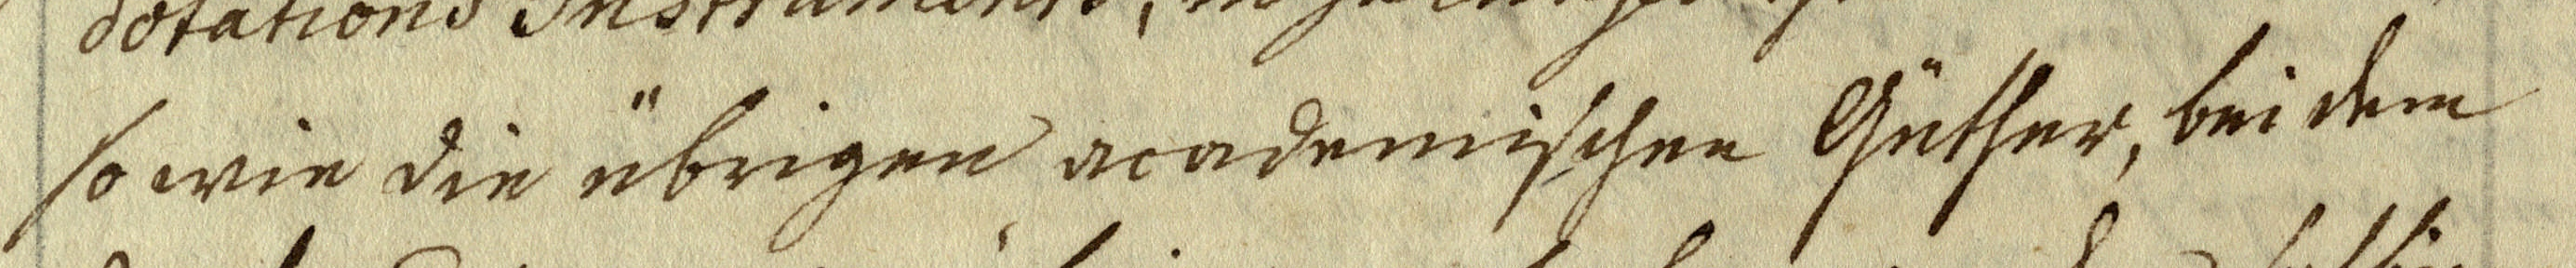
so wie die übrigen academischen Güther, bei dem
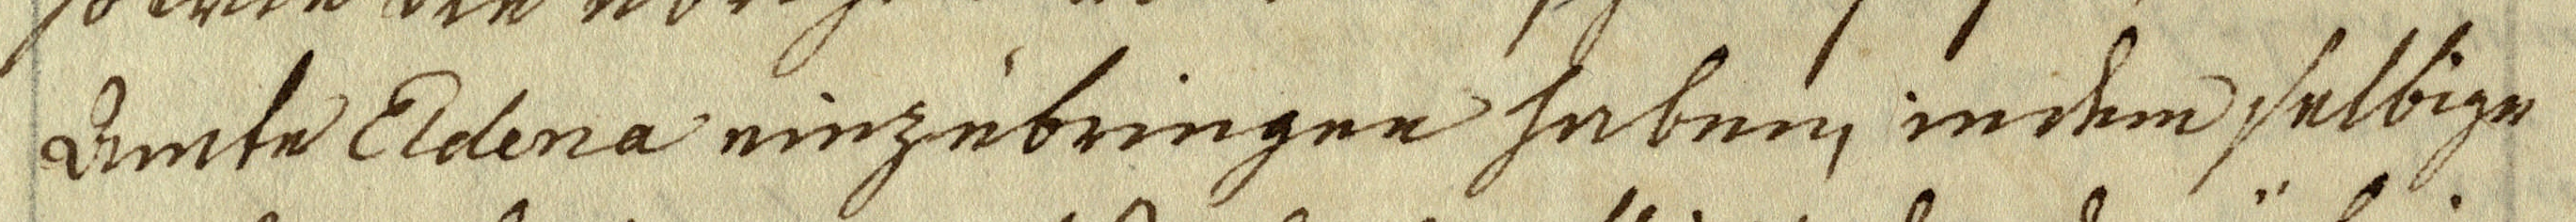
Amte Eldena einzubringen haben, indem selbige
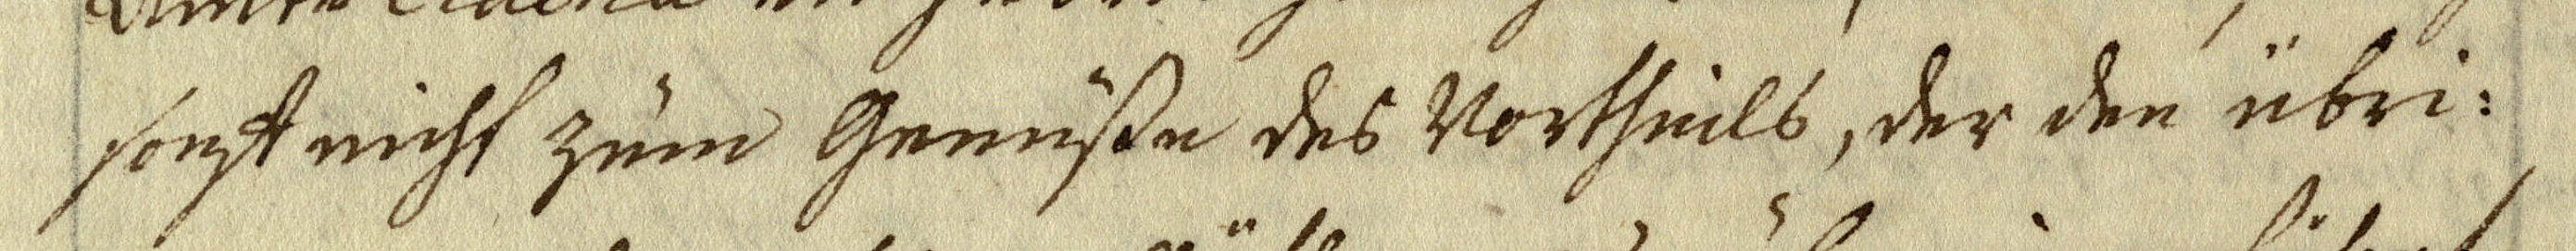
sonst nicht zum Genuße des Vortheils, der den übri¬
